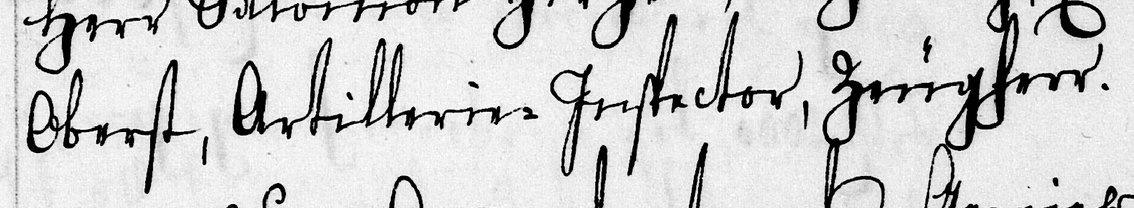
Oberst, Artillerie-Inspector, Zeugherr.
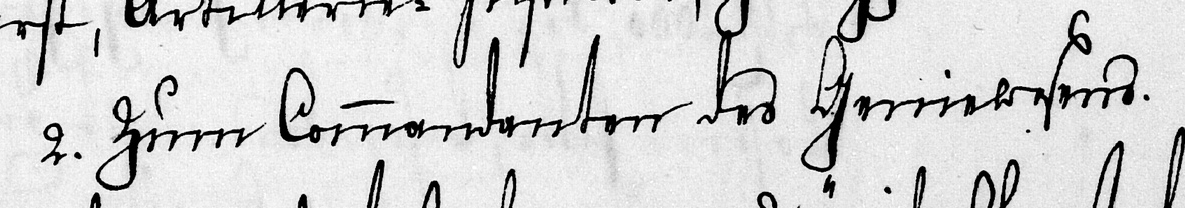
2. Zum Commandanten des Geniewesens:
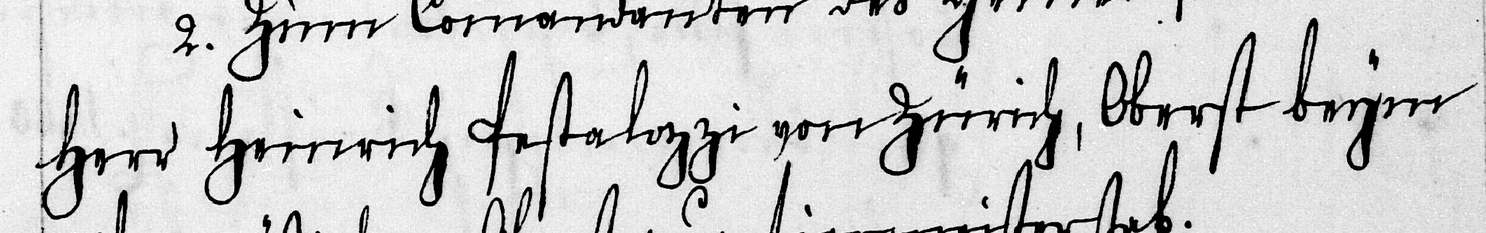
Herr Heinrich Pestalozzi von Zürich, Oberst beym
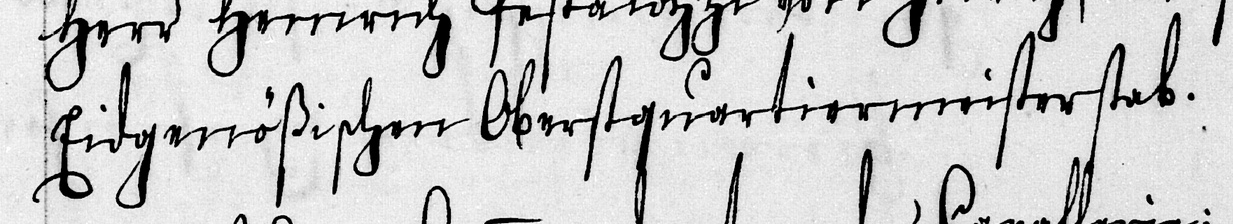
Eidgenößischen Oberstquartiermeisterstab.
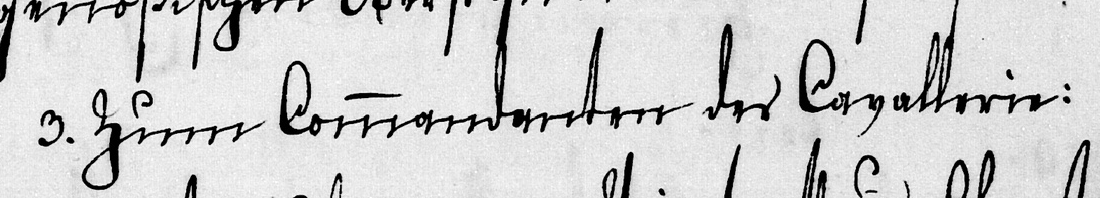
3. Zum Commandanten der Cavallerie:
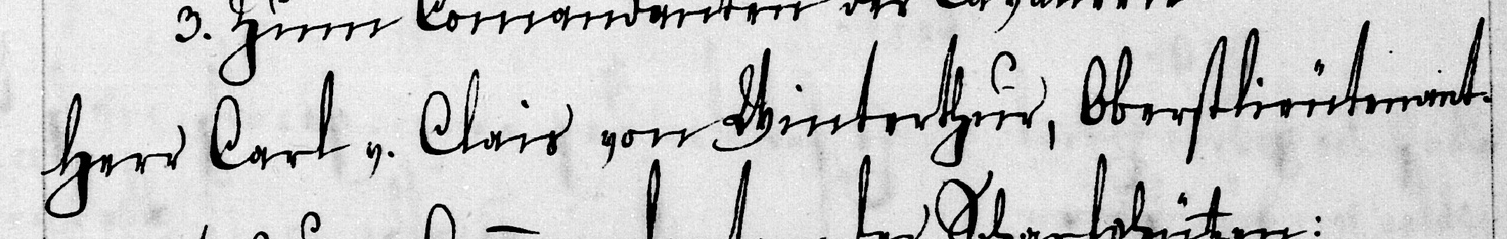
Herr Carl v. Clais von Winterthur, Oberstlieutenant.
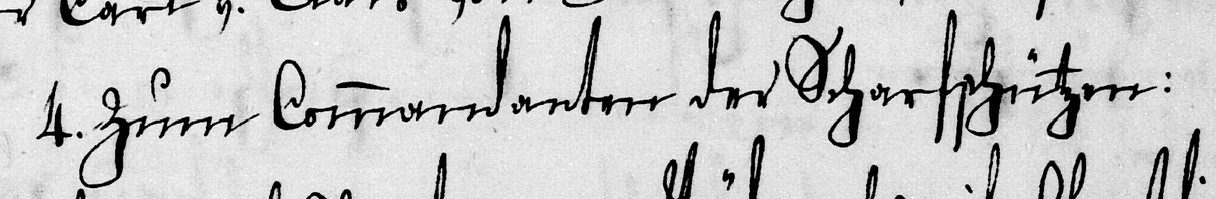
4. Zum Commandanten der Scharfschützen:
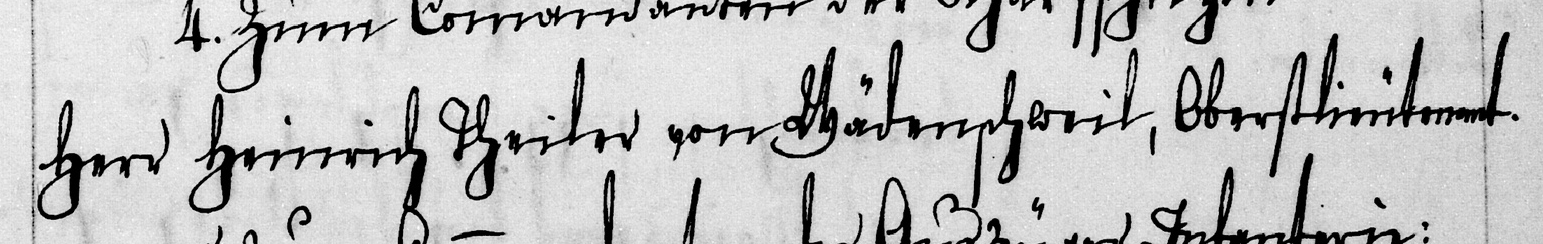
Herr Heinrich Theiler von Wädenschweil, Oberstlieutena¬
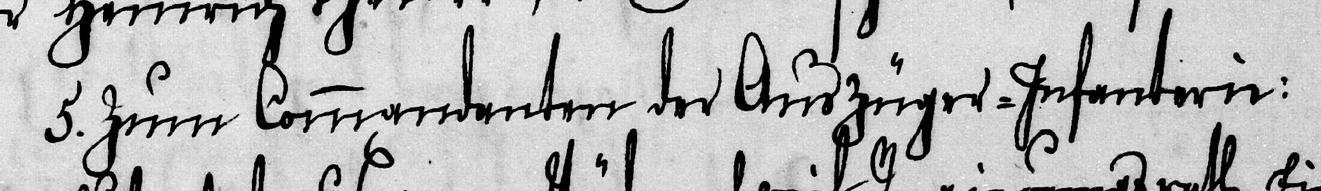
5. Zum Commandanten der Auszüger-Infanterie:
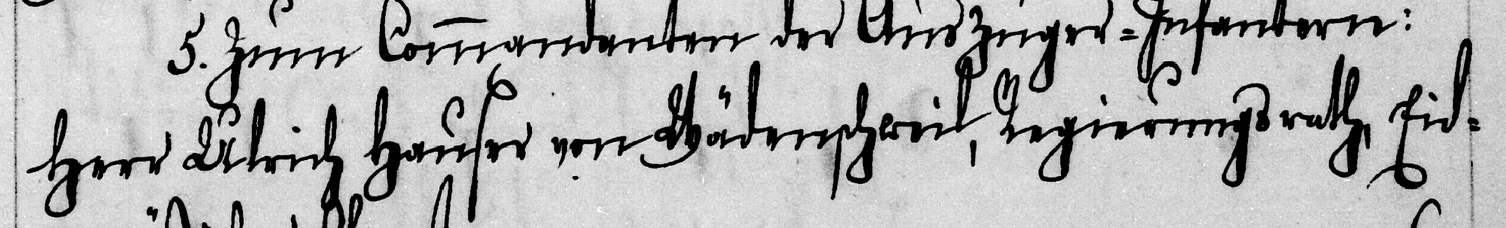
Herr Ulrich Hauser von Wädenschweil, Regierungsrath, Eid¬
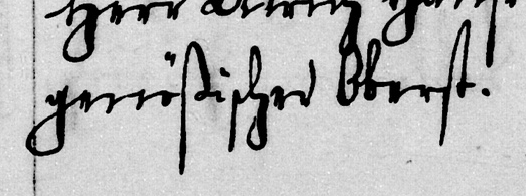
genößischer Oberst.
